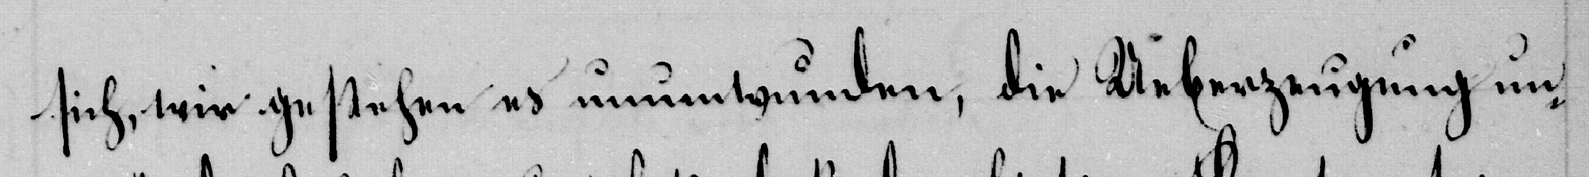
sich, wir gestehen es unumwunden, die Ueberzeugung un¬
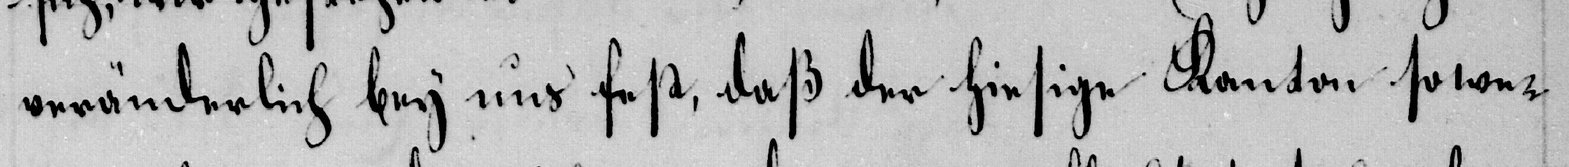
veränderlich bey uns fest, daß der hiesige Kanton, so we¬
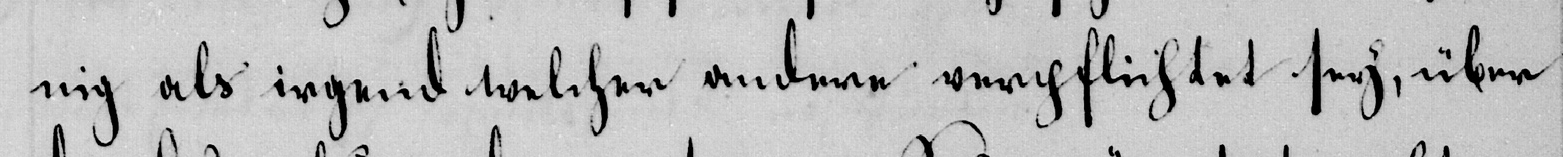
nig als irgend welcher andere verpflichtet sey, über
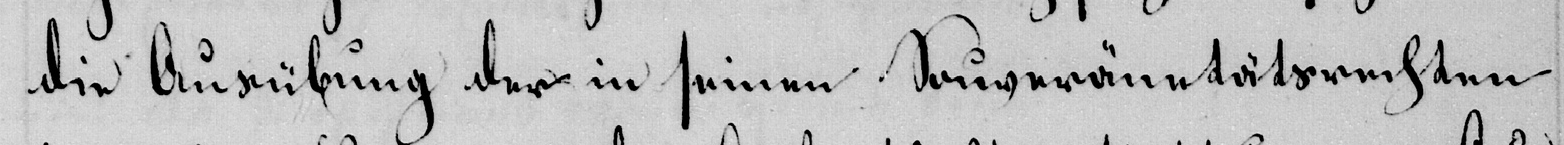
die Ausübung der in seinen Souveränitätsrechten
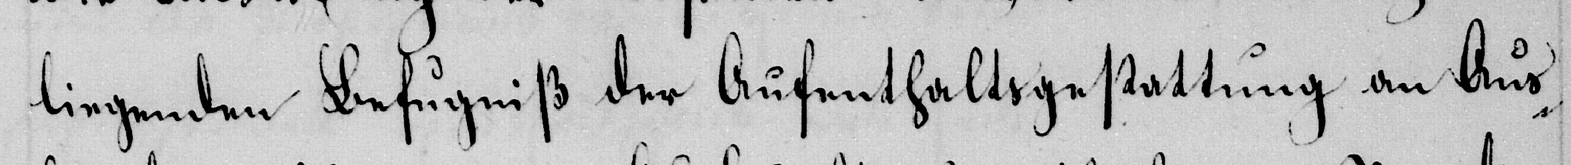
liegenden Befugniß der Aufenthaltsgestattung an Aus¬
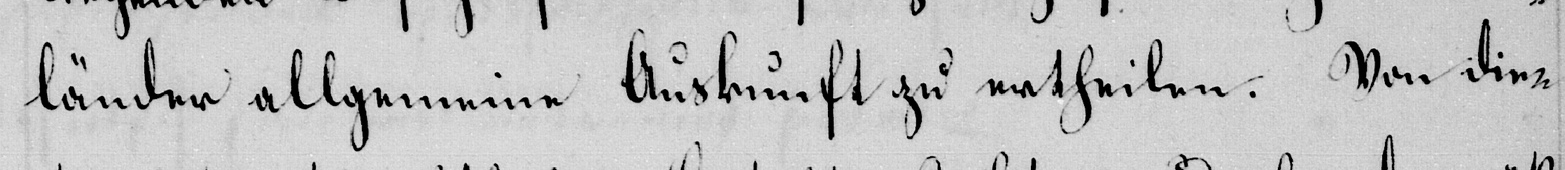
länder allgemeine Auskunft zu ertheilen. Von die¬
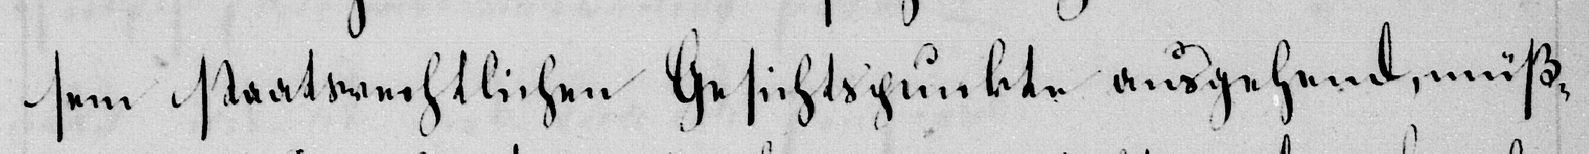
sem staatsrechtlichen Gesichtspunkte ausgehend, müß¬
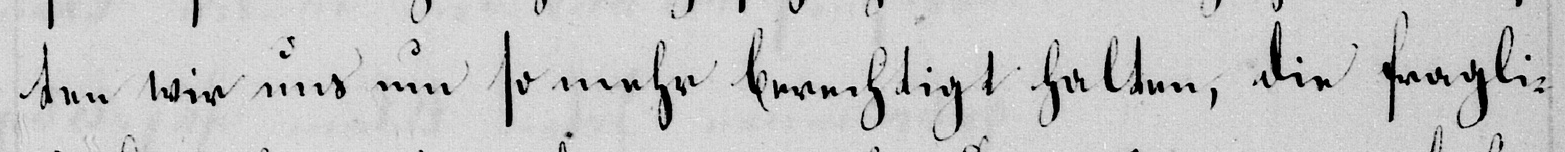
ten wir uns um so mehr berechtigt halten, die fragli¬
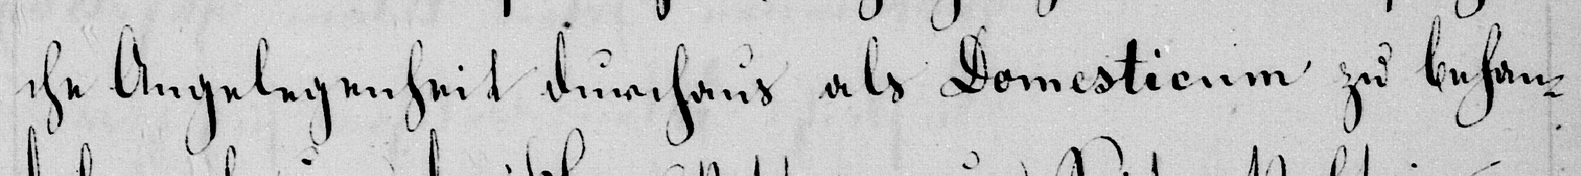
che Angelegenheit durchaus als Domesticum zu behan¬
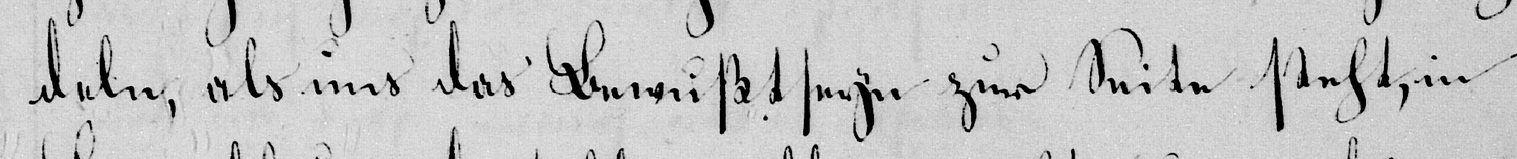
deln, als uns das Bewußtseyn zur Seite steht, in
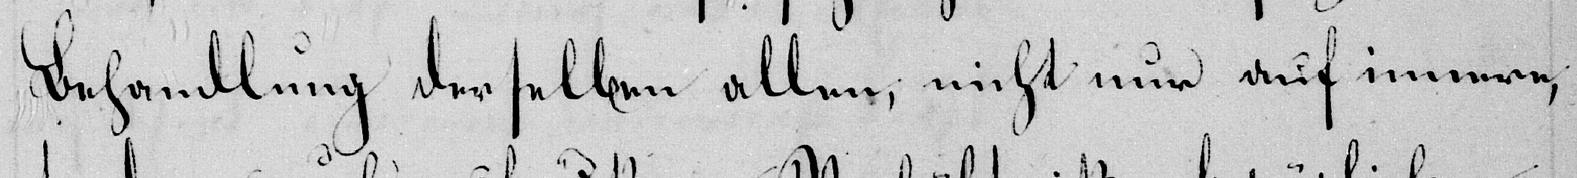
Behandlung derselben allen, nicht nur auf innere,
